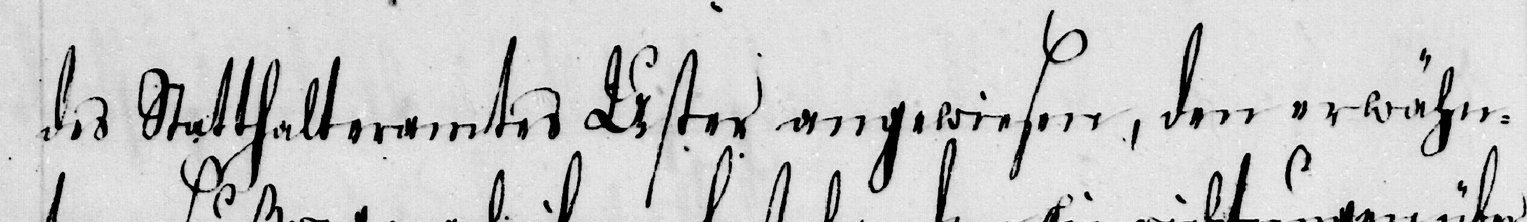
des Statthalteramtes Uster angewiesen, den erwähn¬
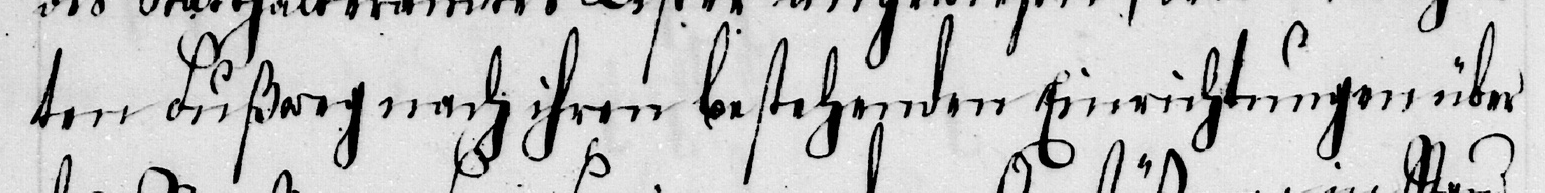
ten Fußweg nach ihren bestehenden Einrichtungen über
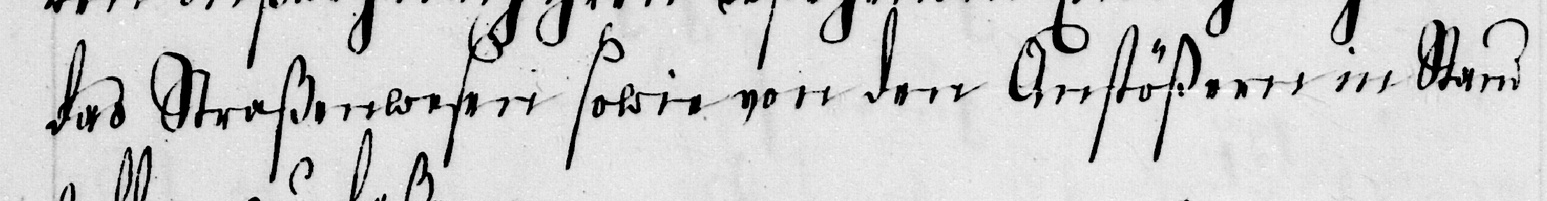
das Straßenwesen sowie von den Anstößern in Stand
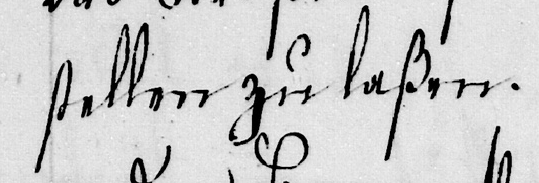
stellen zu laßen.
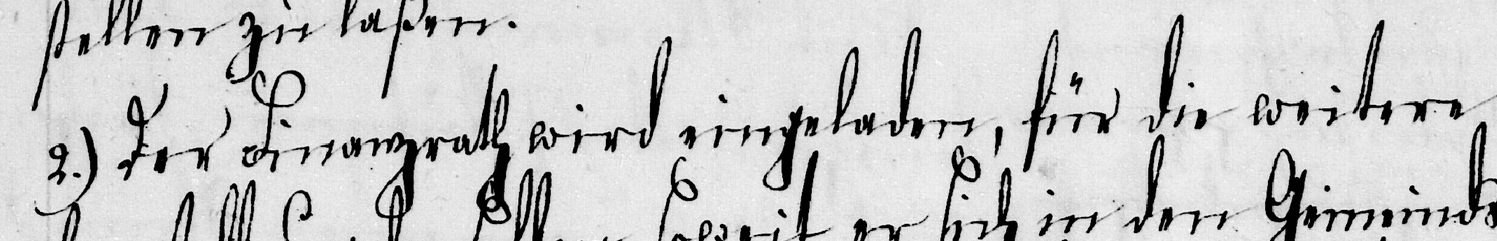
2.) Der Finanzrath wird eingeladen, für die weitere
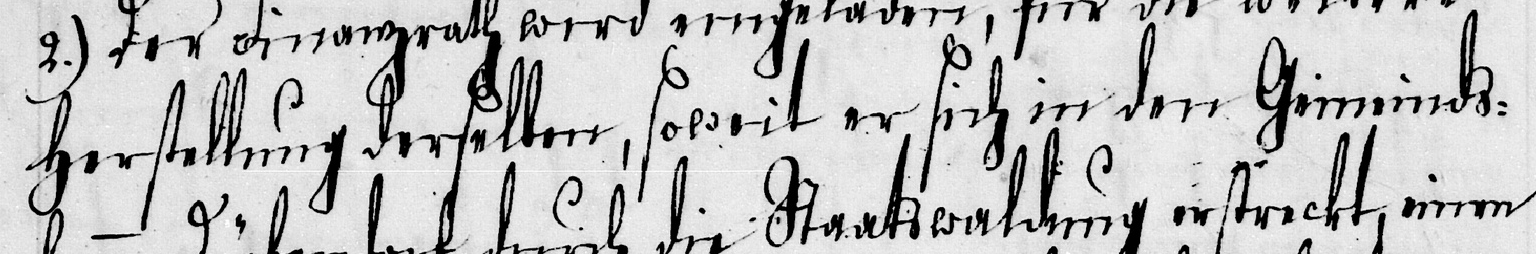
Herstellung derselben, soweit er sich in den Gemeinds¬
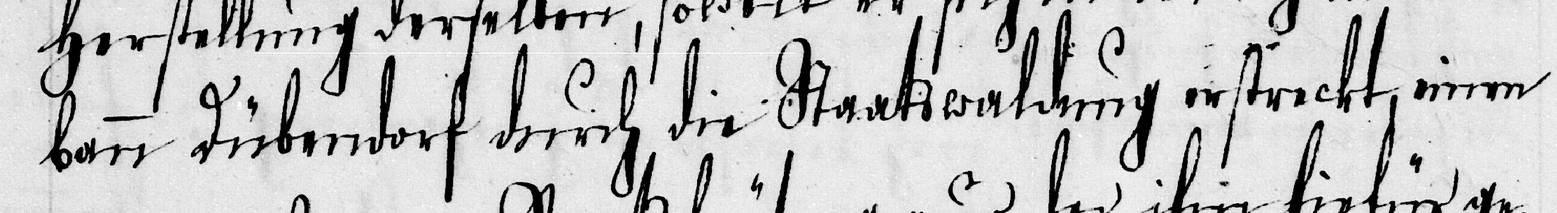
bann Dübendorf durch die Staatswaldung erstreckt, ein¬
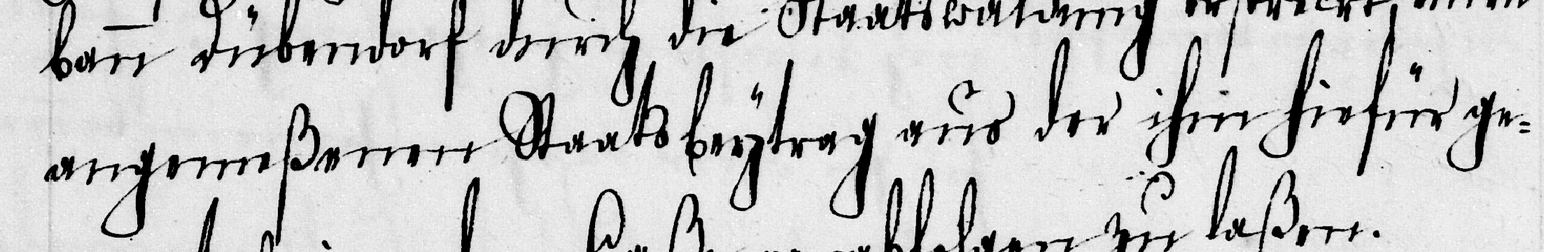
angemeßenen Staatsbeytrag aus der ihm hiefür ge¬
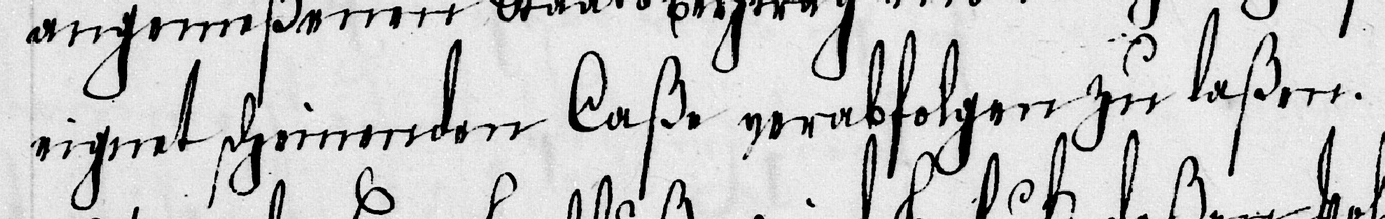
eignet scheinenden Caße verabfolgen zu laßen.
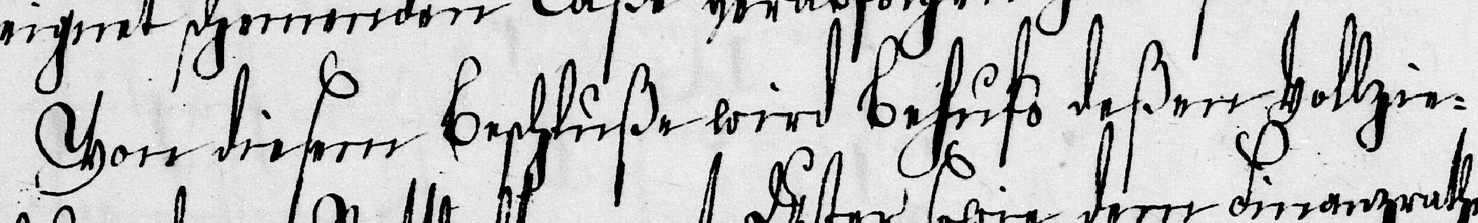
Von diesem Beschluße wird Behufs deßen Vollzie¬
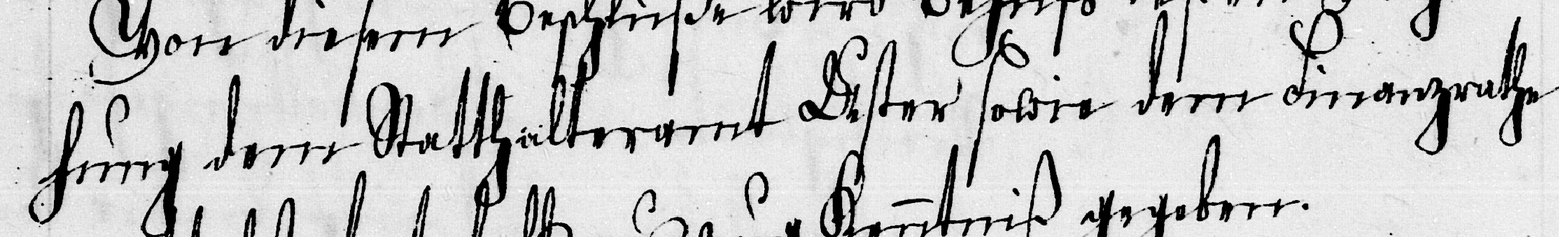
hung dem Statthalteramt Uster sowie dem Finanzrathe
